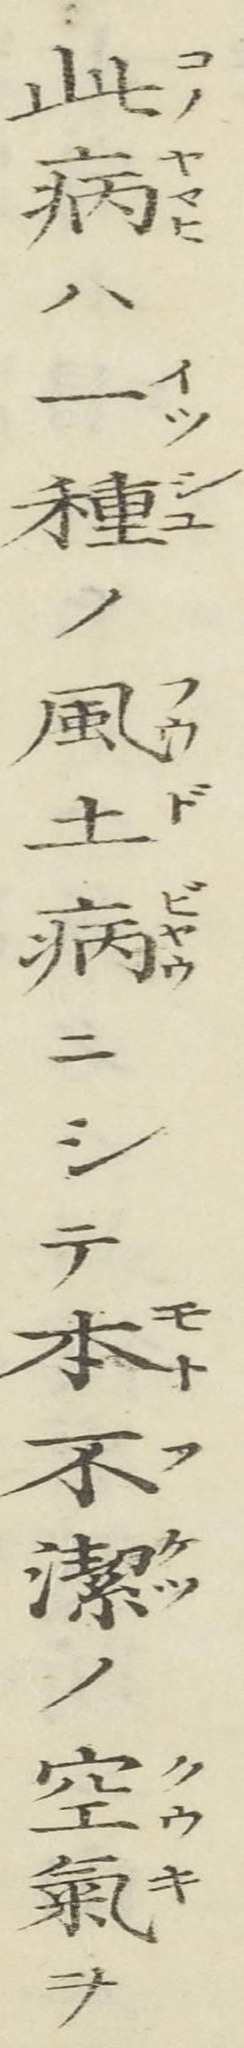此病ハ一種ノ風土病ニシテ本不潔ノ空気ヲ
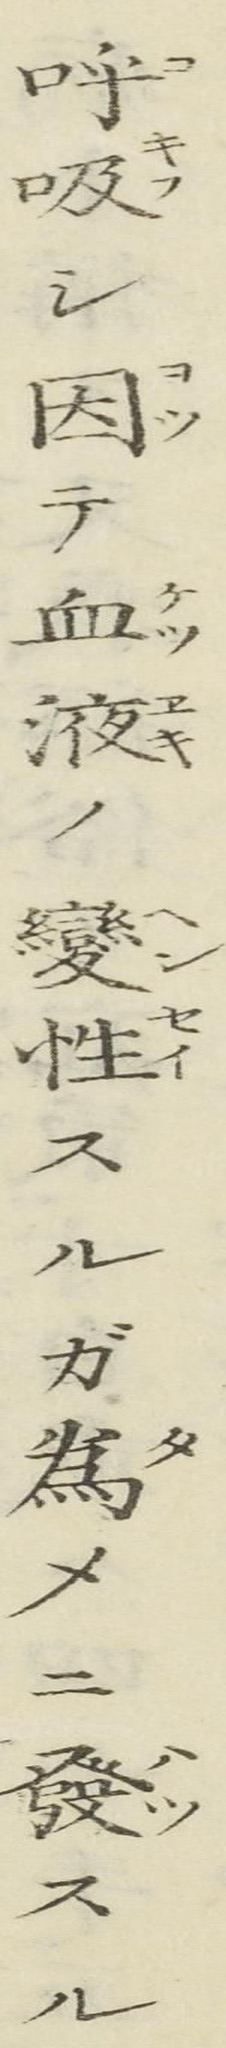呼吸シ因テ血液ノ変性スルガ為メニ発スル
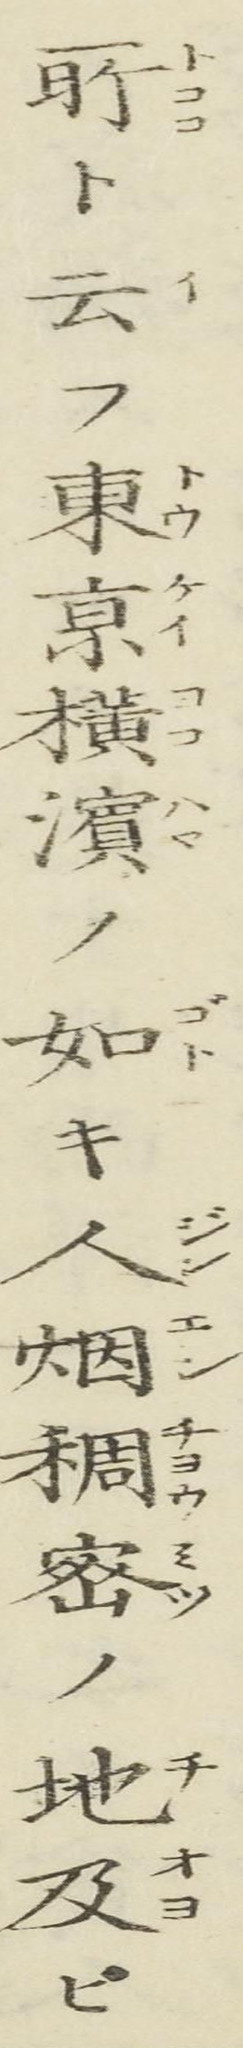所ト云フ東京横浜ノ如キ人烟稠密ノ地及ビ
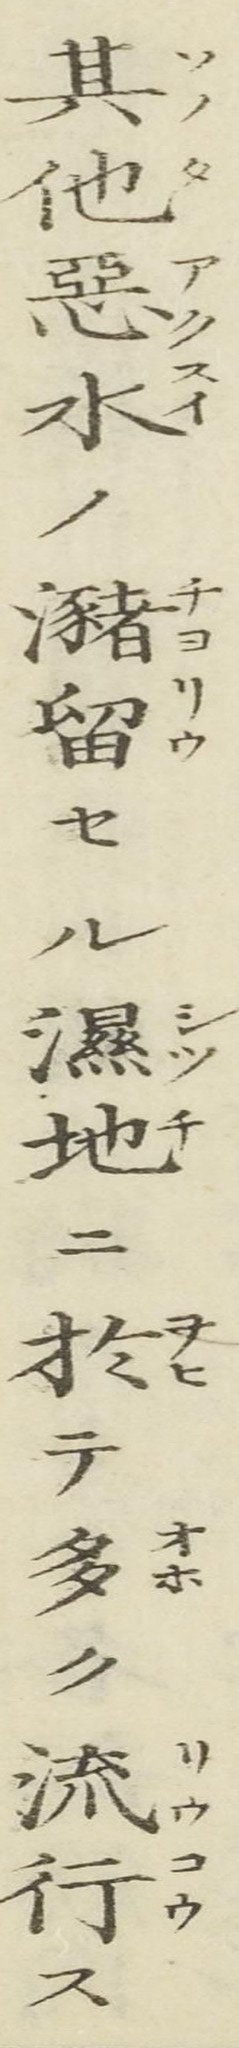其他悪水ノ瀦留セル湿地ニ於テ多ク流行ス
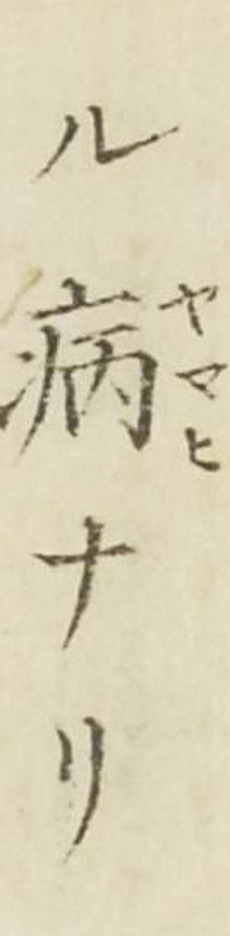ル病ナリ
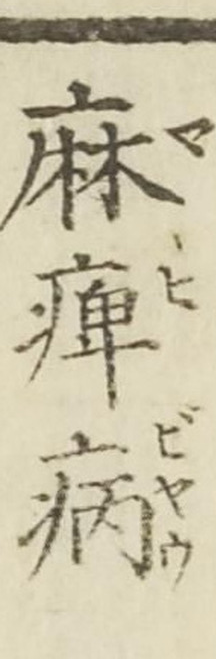麻痺病
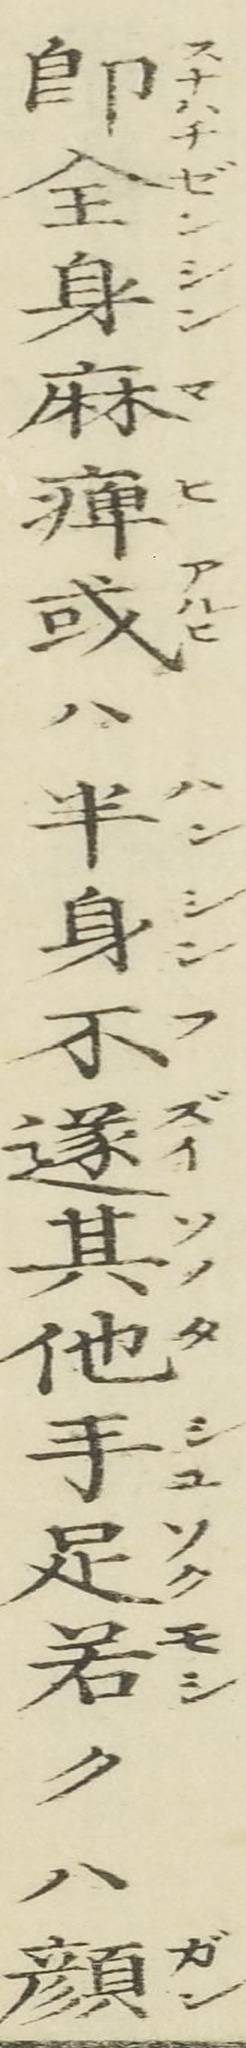即全身麻痺或ハ半身不遂他手足若クハ顔
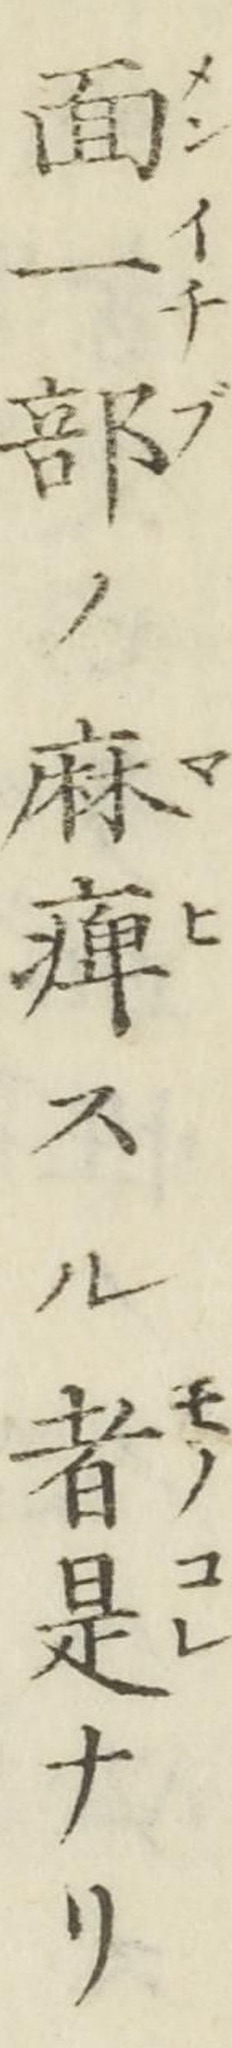面一部ノ麻痺スル者是ナリ
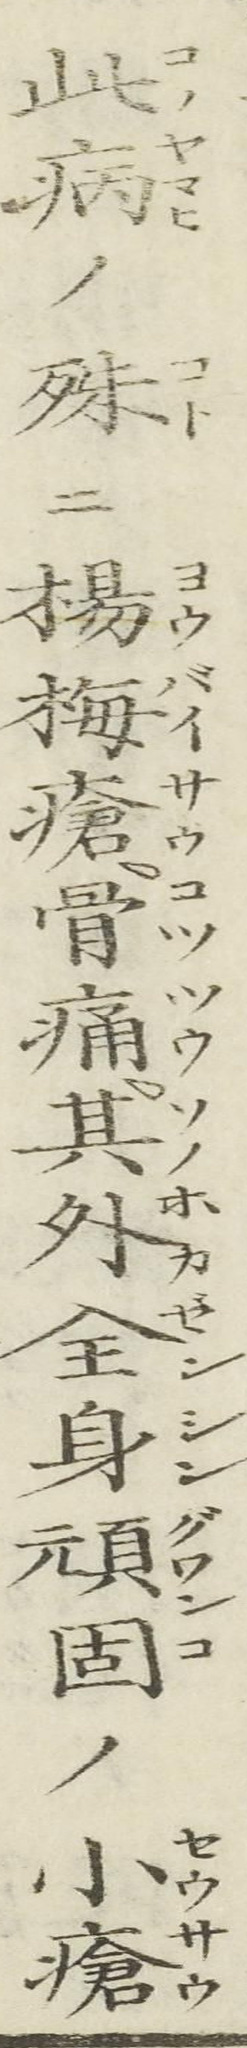此病ノ殊ニ楊梅瘡、骨痛、其外全身頑固ノ小瘡
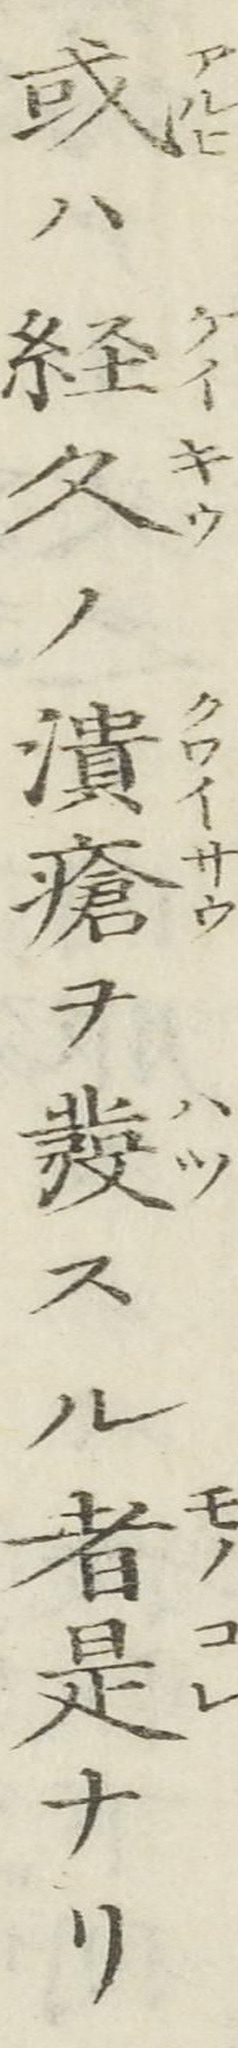或ハ経久ノ潰瘡ヲ発スル者是ナリ
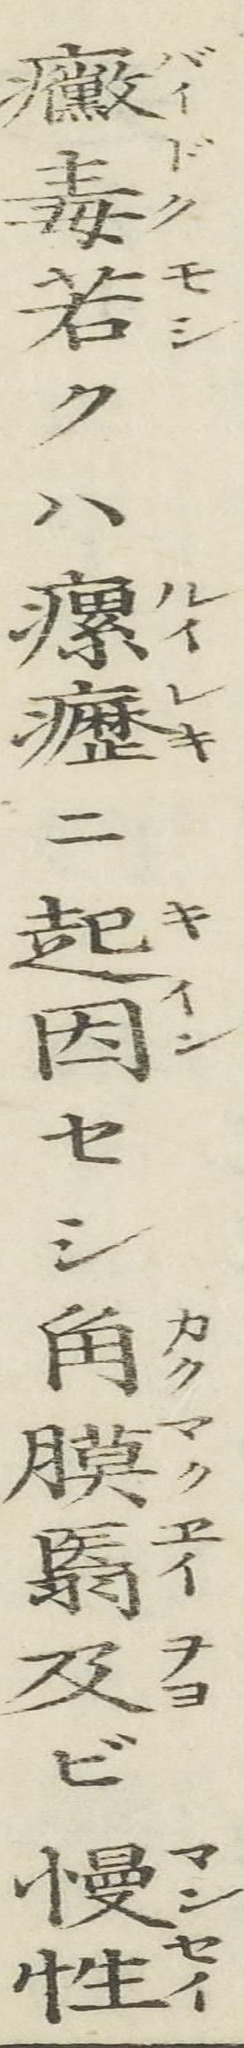黴毒若クハ瘰癧ニ起因セシ角膜𦑄及ビ慢性
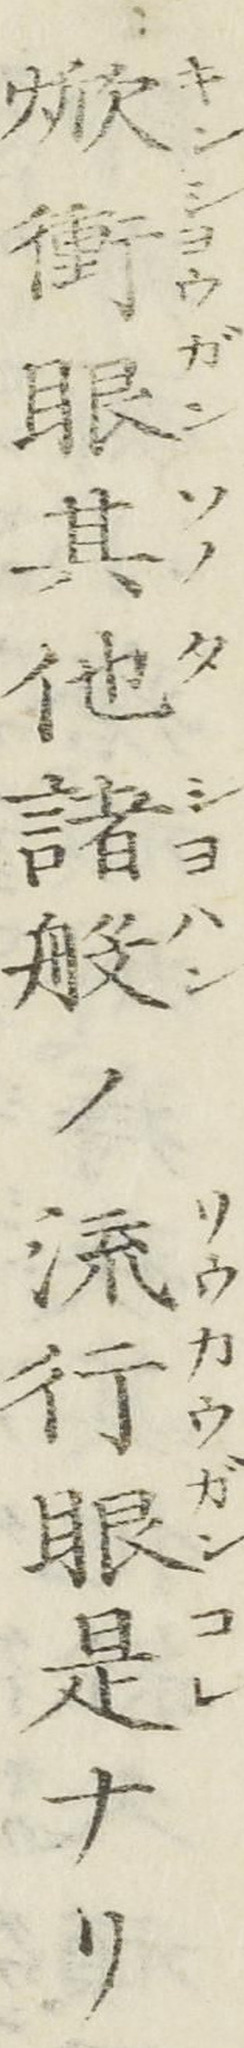焮衝眼其他諸般ノ流行眼是ナリ
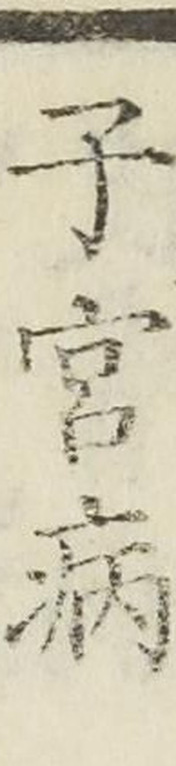子宮病
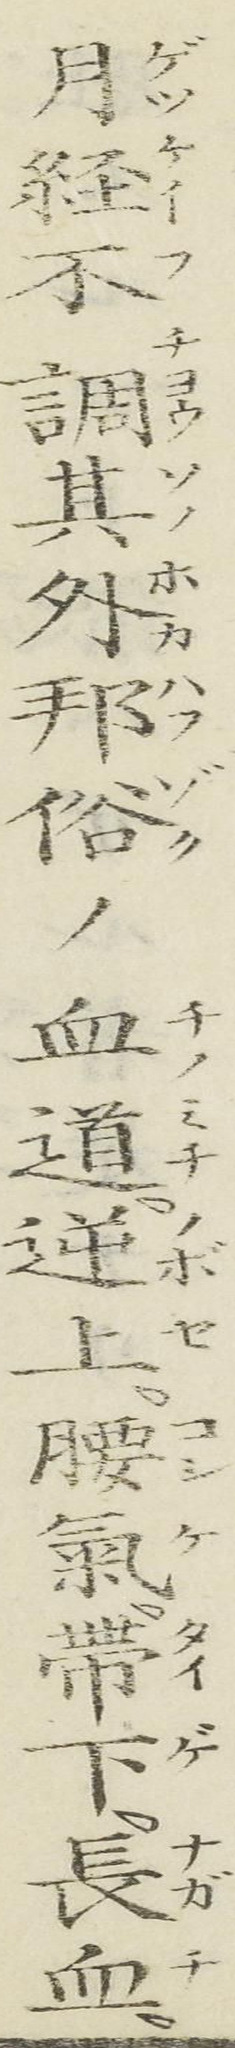月経不調其外邦俗ノ血道、逆上、腰気、帯下、長血、
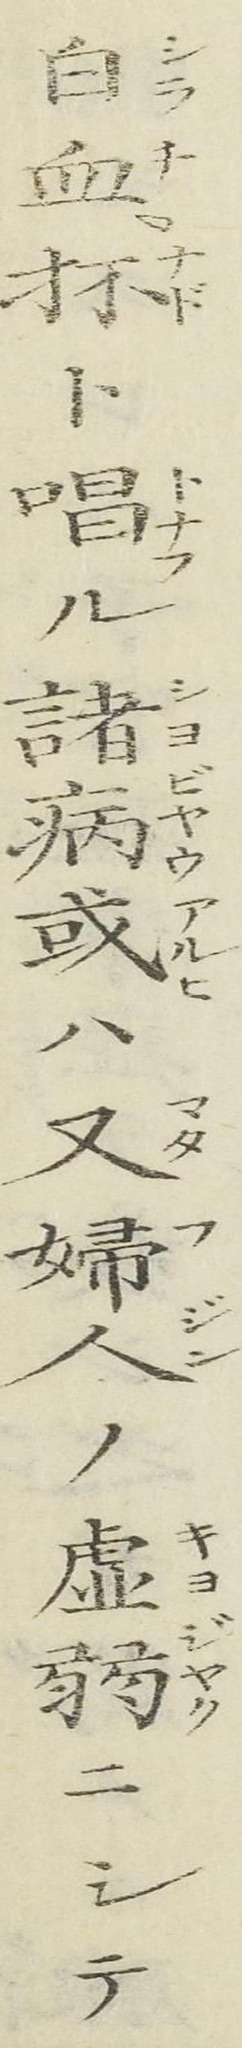白血、抔ト唱ル諸病或ハ又婦人ノ虚弱ニシテ

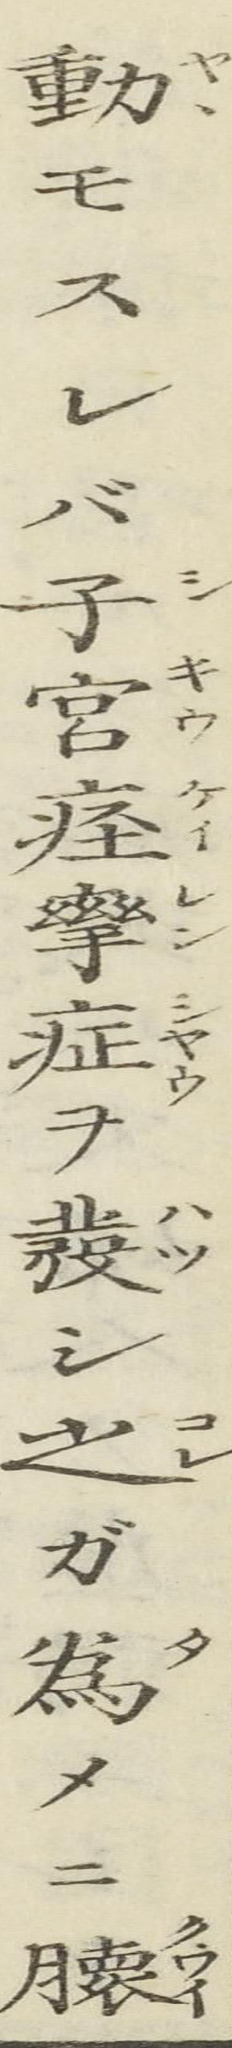動モスレバ子宮痙攣症ヲ発シ之ガ為メニ懐
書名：熱海温泉考　全
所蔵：東京大学地震研究所図書室 Earthquake Research Institute Library, The University of Tokyo, JAPAN
